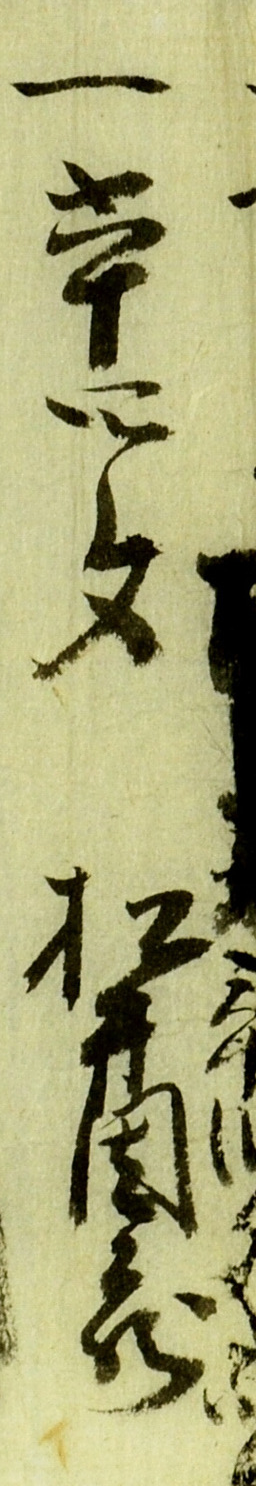一六十四文松井周蔵
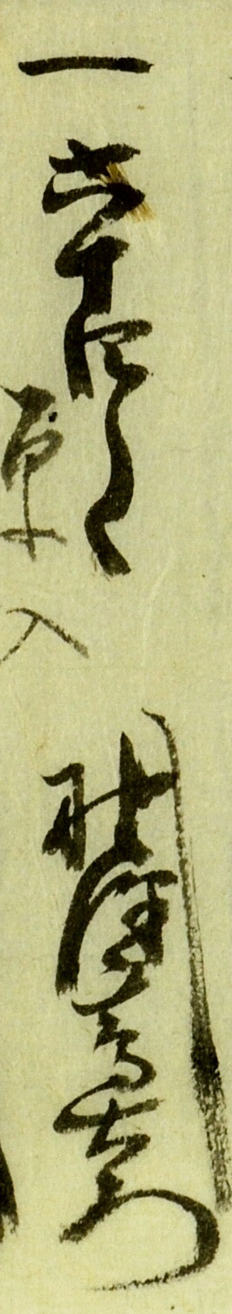一六十四文野沢蔦右衛門
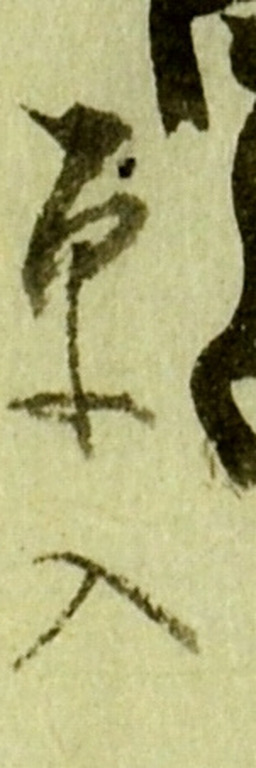百文入
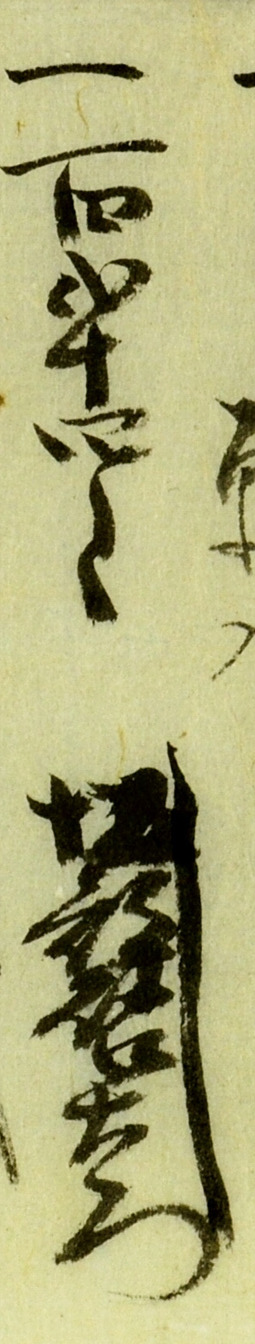一百弐十四文坂部啓右衛門
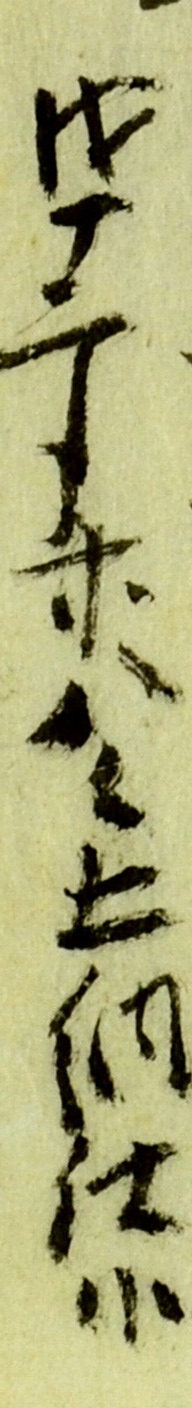戌十二月廿八日上納仕候
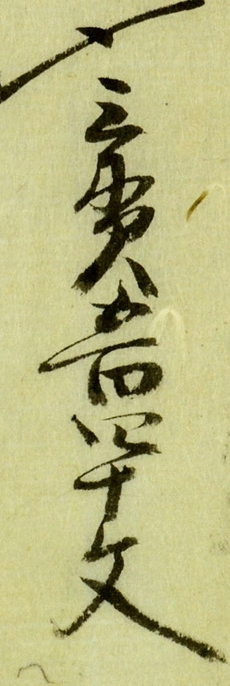〆三貫五百四十文
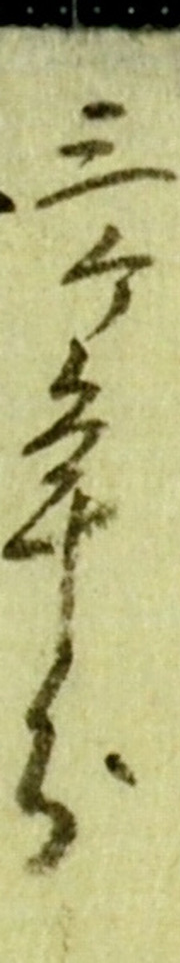三ヶ年分
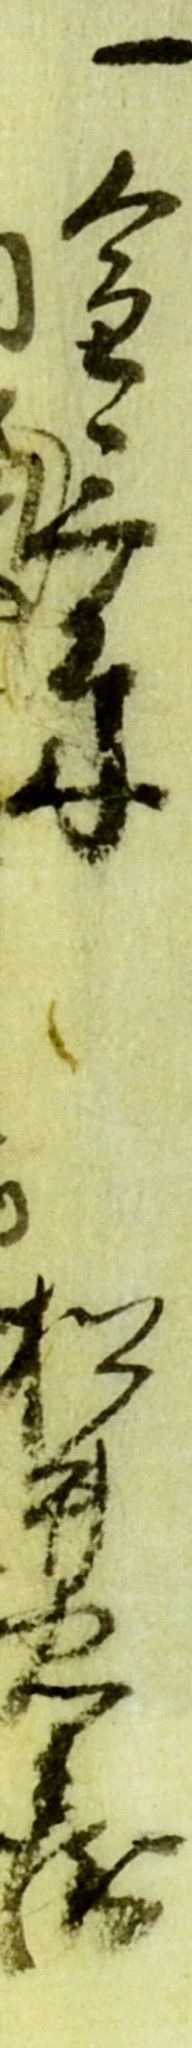一金三朱松井忠兵衛
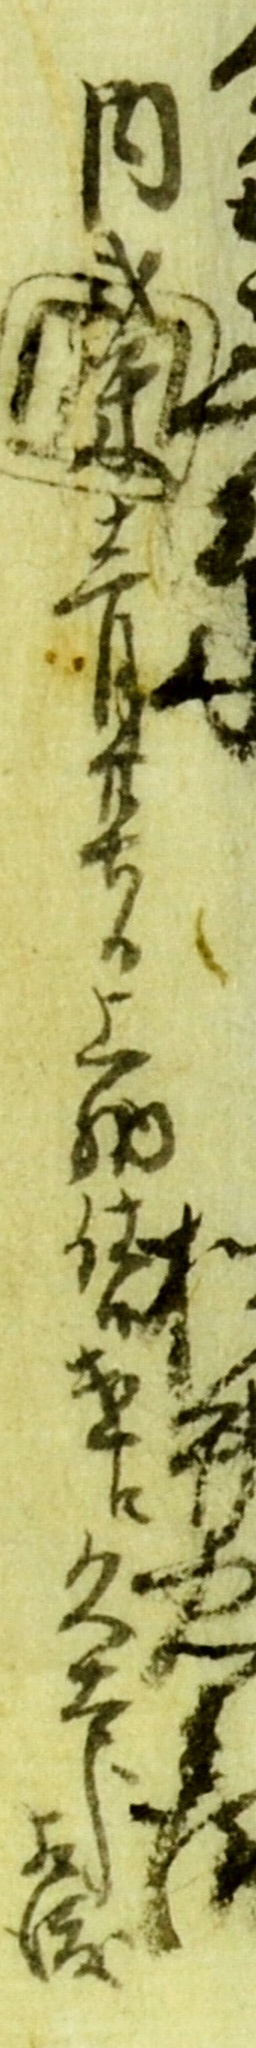内弐朱十二月廿七日上納仕候遣に久太郎相渡

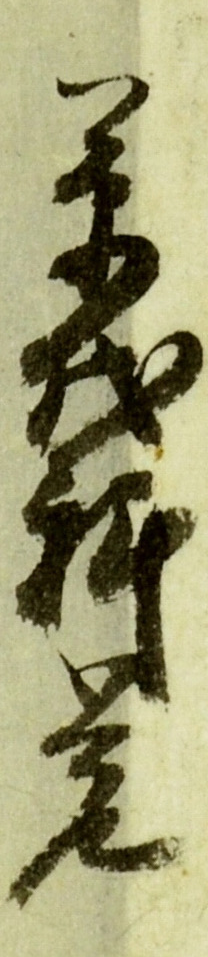米代料覚
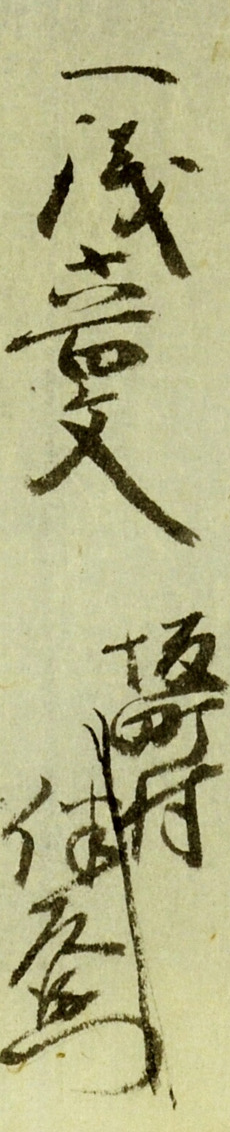一銭六百文板町村伴左衛門
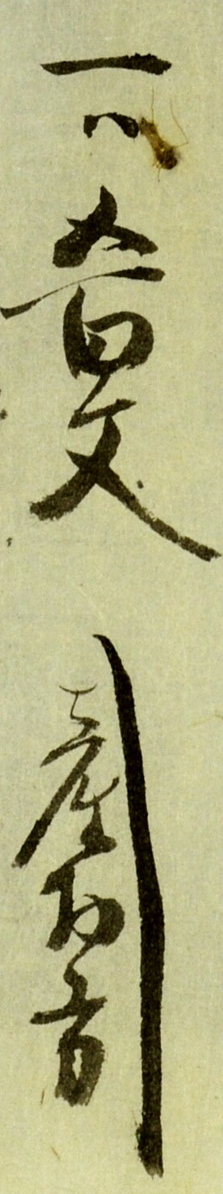一同五百文産助方
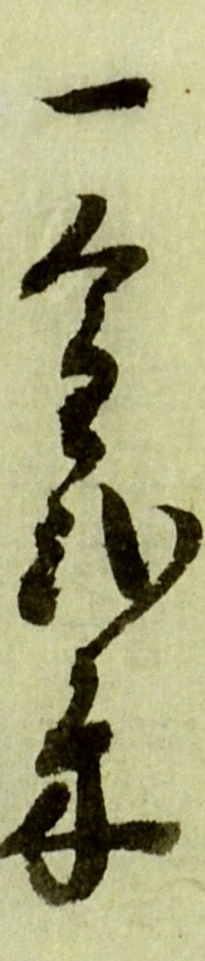一金弐朱
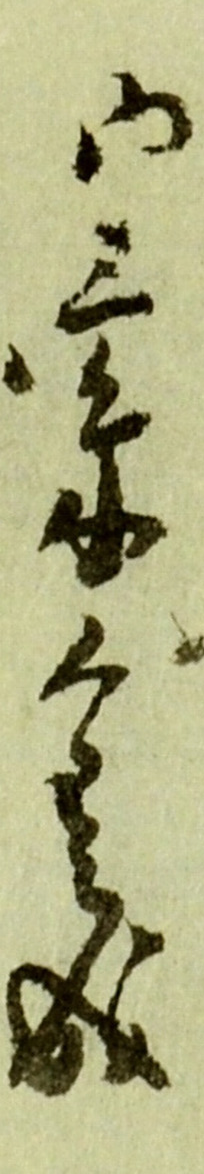内三朱金に成
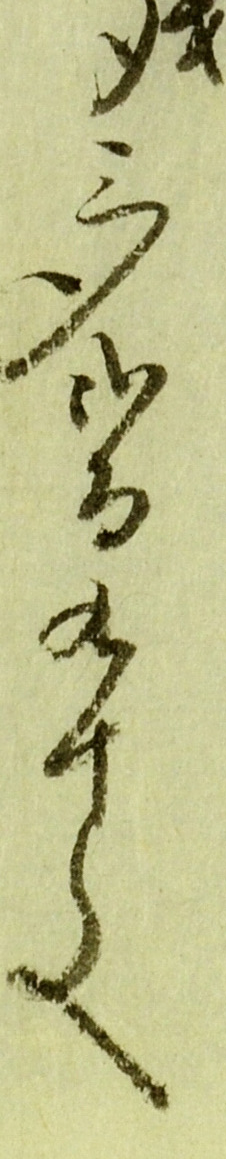残三〆弐百九十文
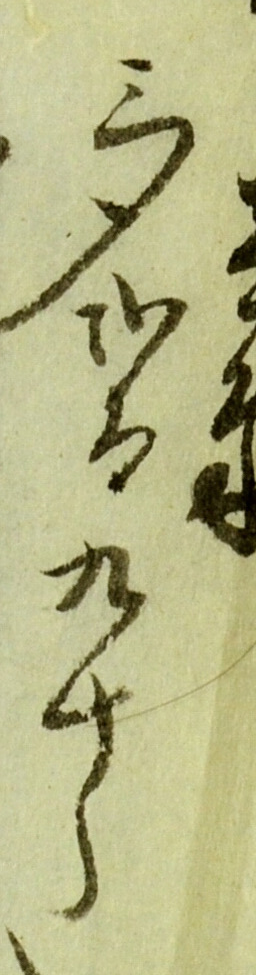残三〆弐百九十文
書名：覚
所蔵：伊那市立高遠町図書館・合同会社AMANE
